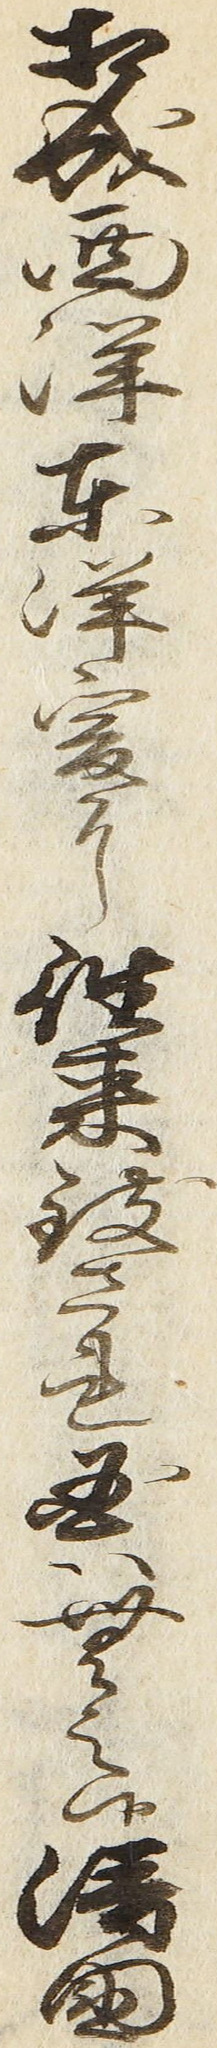相成西洋東洋爰に往来致さす国ハ無之候清國
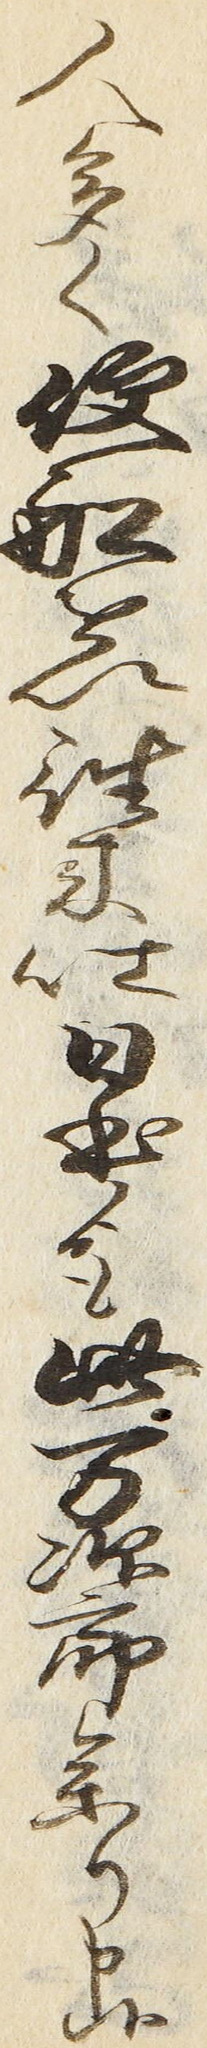人多く便舩を以往来仕日本ゟも此万次郎参り申候
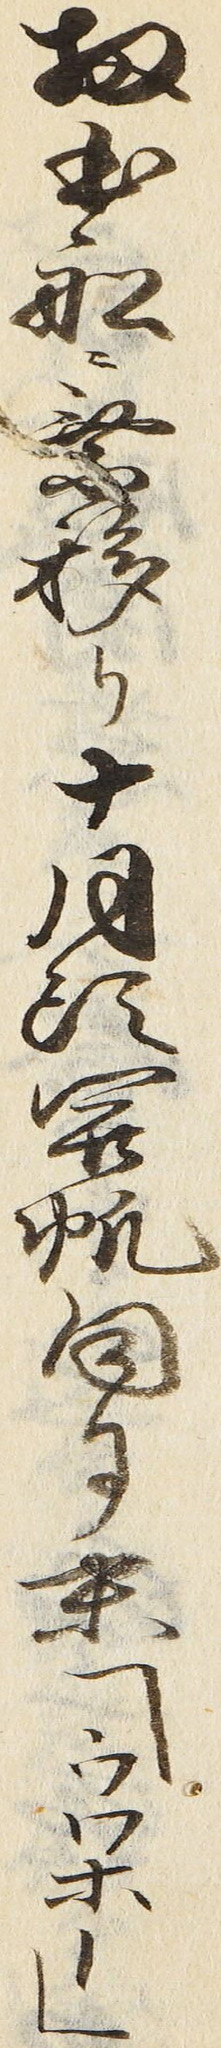扠本舩ニ乗移り十月頃開帆同月末「ウワホー」
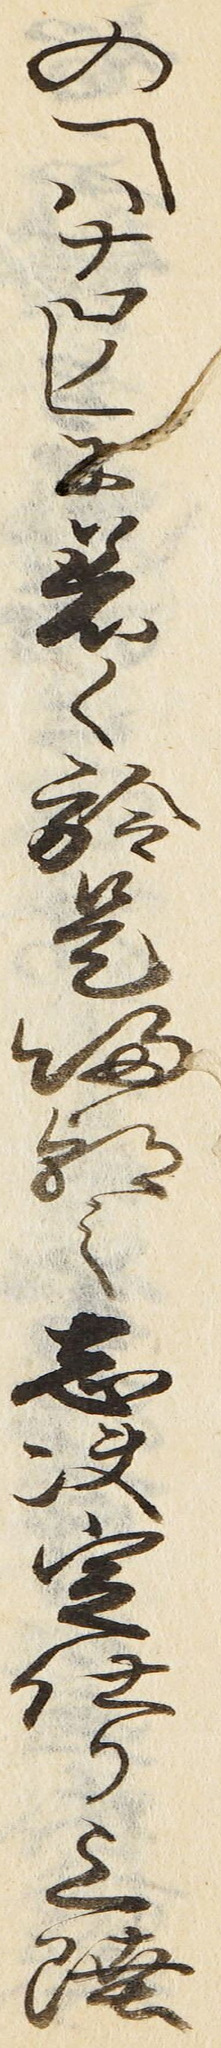の「ハナロノ」に着く於是帰朝之志決定仕り上陸
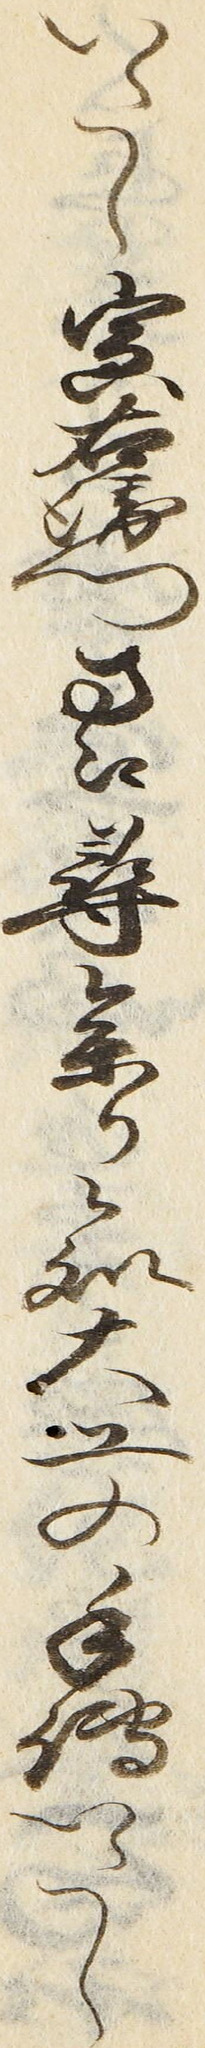いたし寅右衛門方江尋参り候処大工の手傳いたし
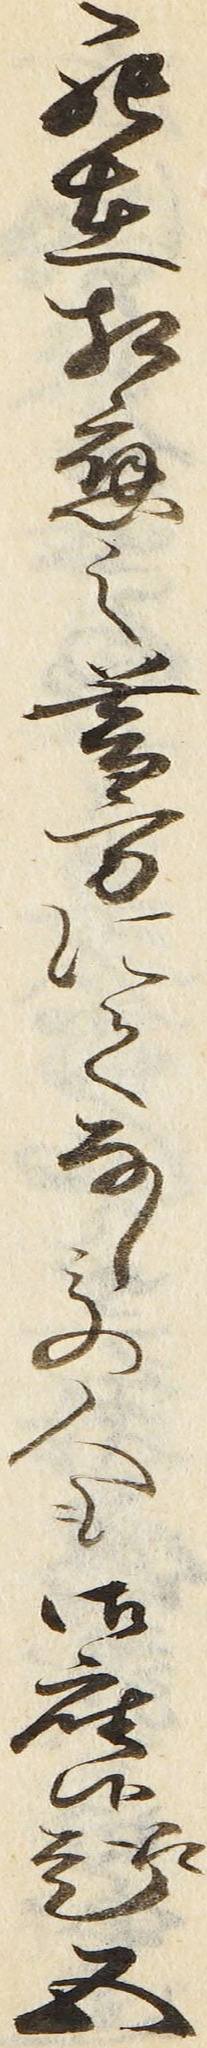罷在相應之暮方にてなしみの人も御座候趣五
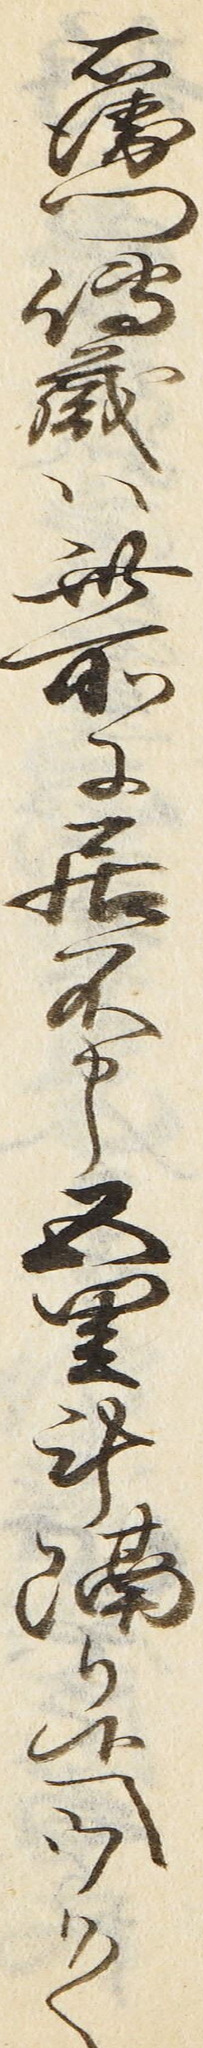右衛門傳蔵ハ此所に居不申五里斗隔り候「ウク〳〵
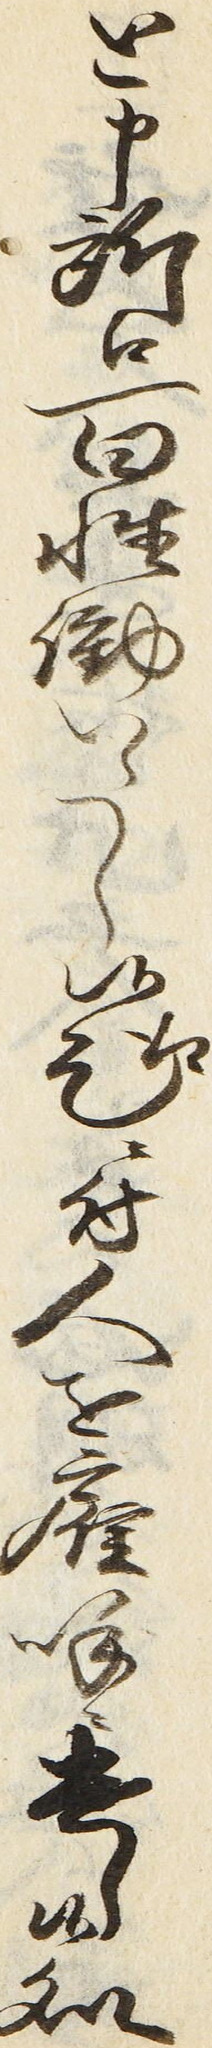と申所江百姓働いたし候趣ニ付人を雇呼ニ遣し候処
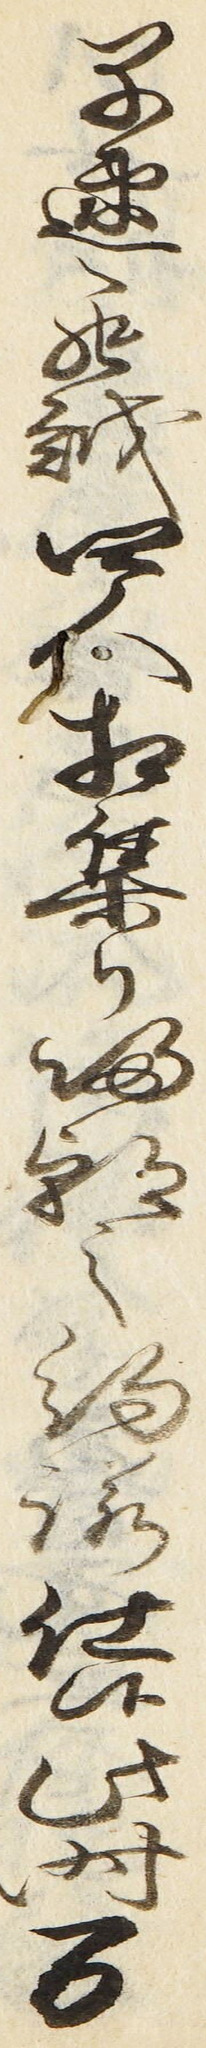早速罷越四人相集り帰朝之約諾仕候此時万
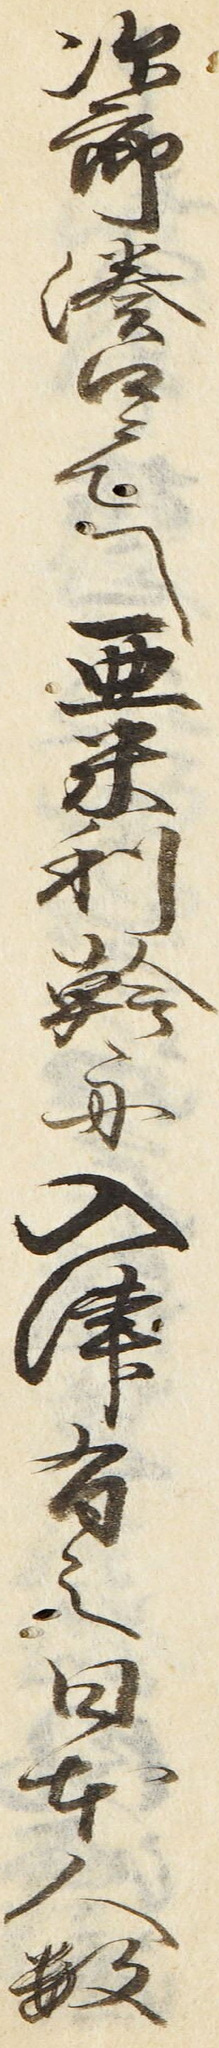次郎湊口ニて「亜米利幹舟入津有之日本人数
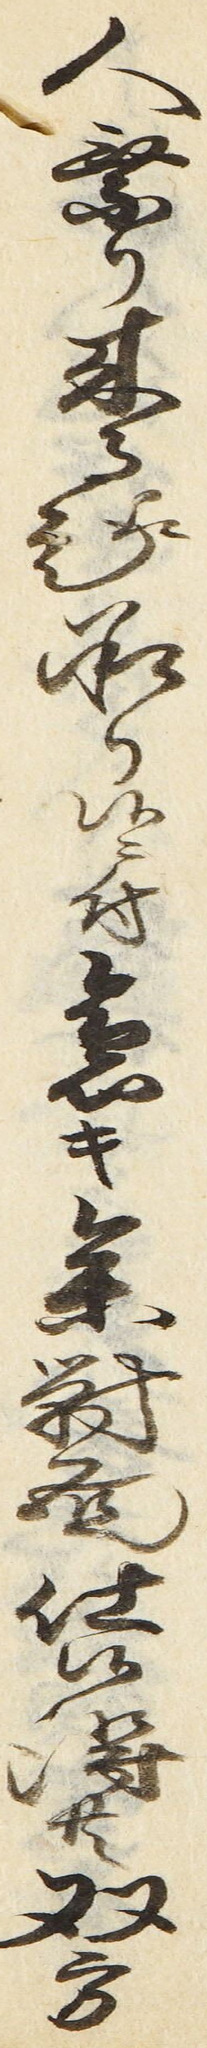人乗り来る趣承り候ニ付急キ参對面仕候得共双方
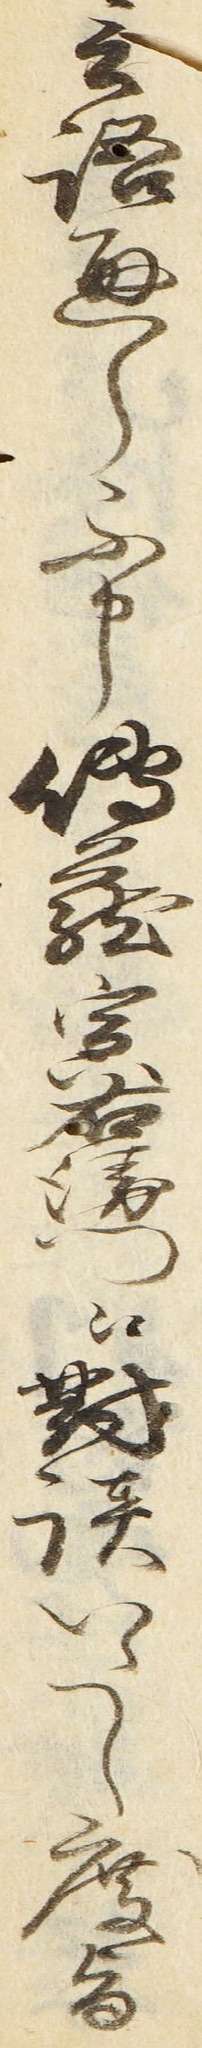言語通し不申傳蔵寅右衛門江對面いたし度旨

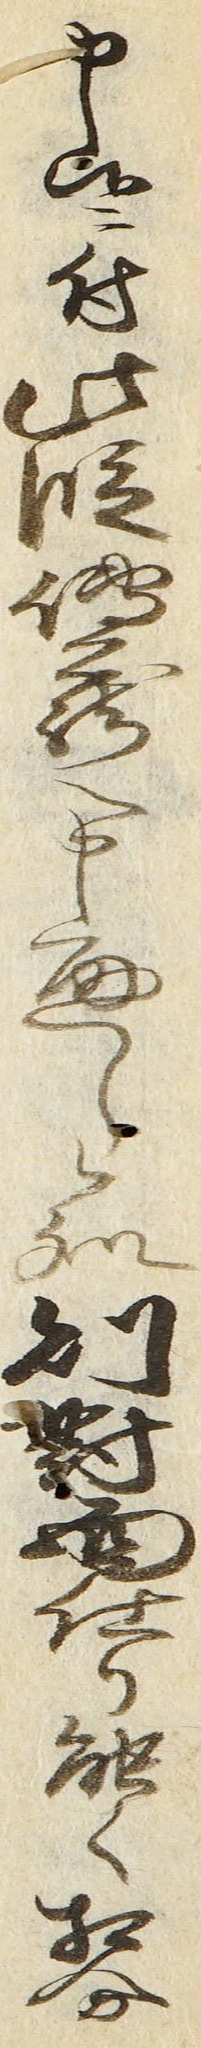申候ニ付此段傳蔵へ申通し候処則對面仕り能く相分
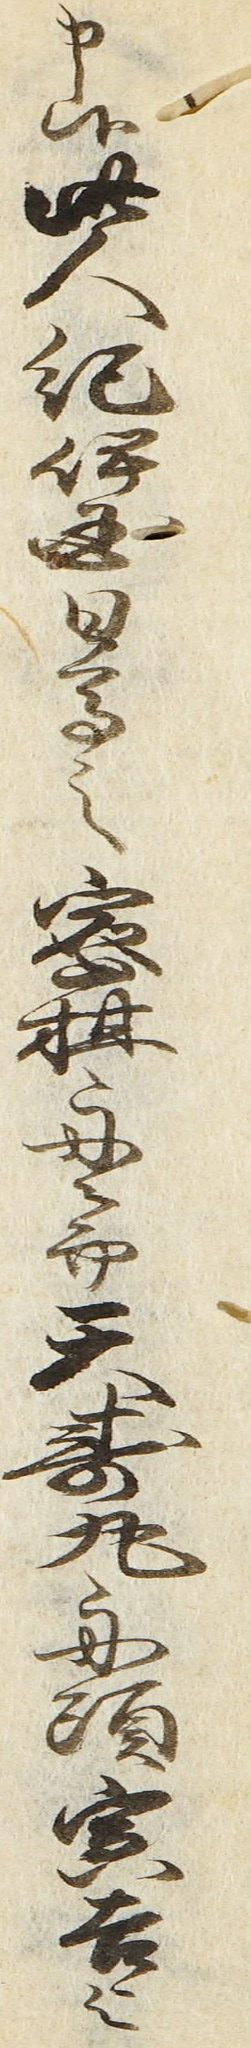申候此人紀伊国日高之蜜柑舟ニ而天寿丸舟頭寅吉と
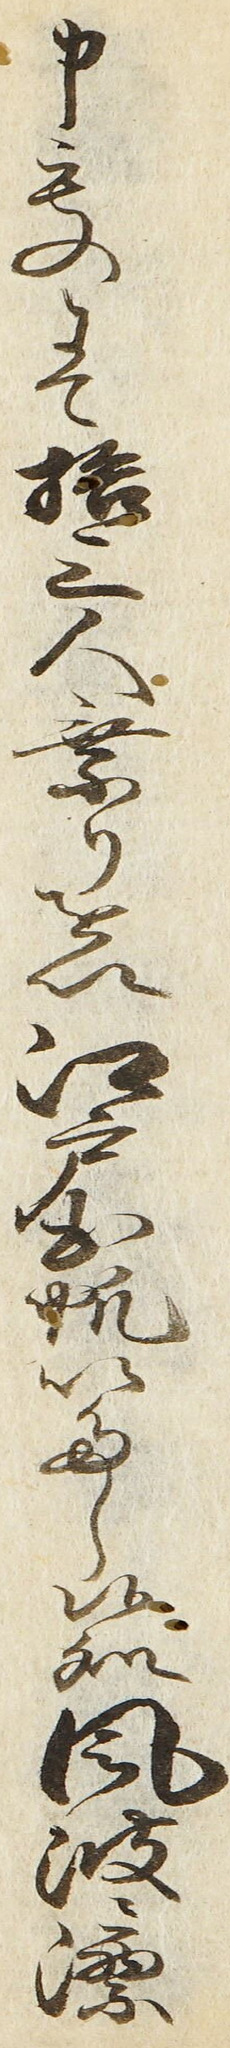申ものにて拾三人乗りを以江戸出帆いたし候処風波ニ漂
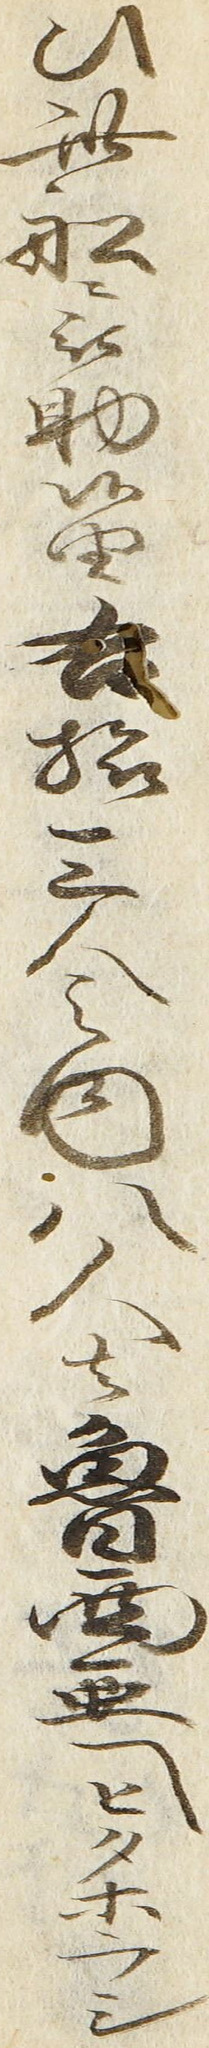ひ此舩ニ被助候由右拾三人之内八人者魯西亜「ヒタホラシ
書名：漂客談寄
